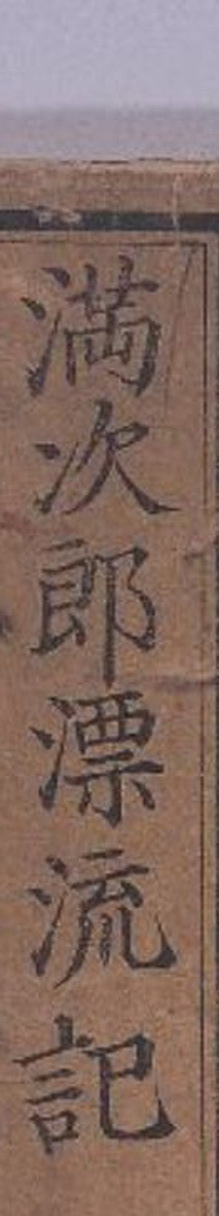満次郎漂流記全
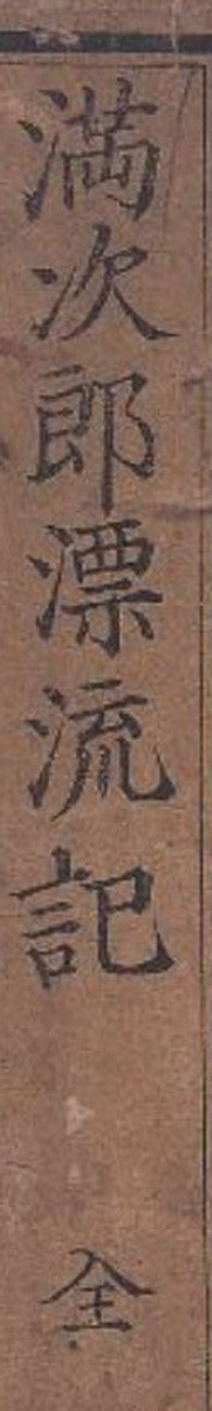満次郎漂流記全

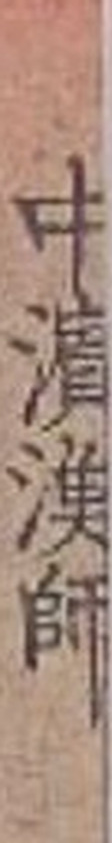中浜漁師
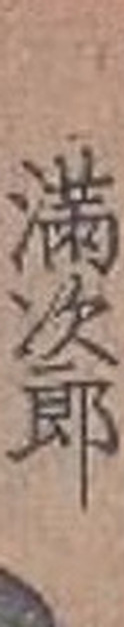満次郎

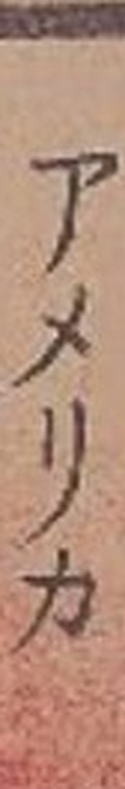アメリカ

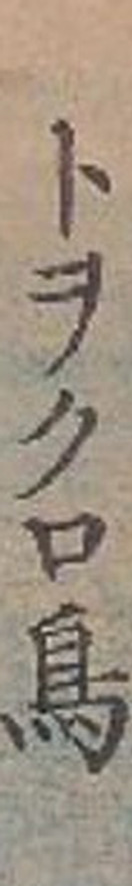トヲクロ鳥

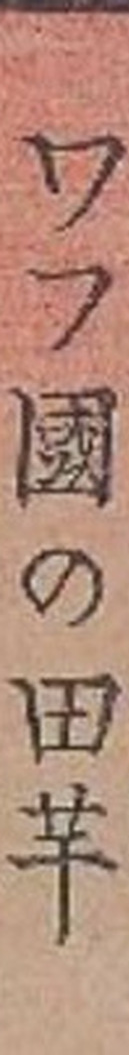ワフ国の田芋
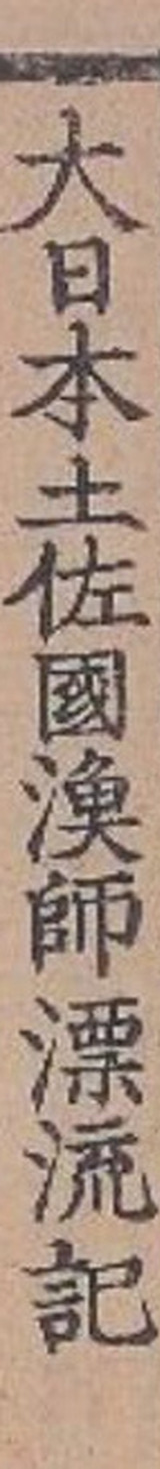大日本土佐国漁師漂流記
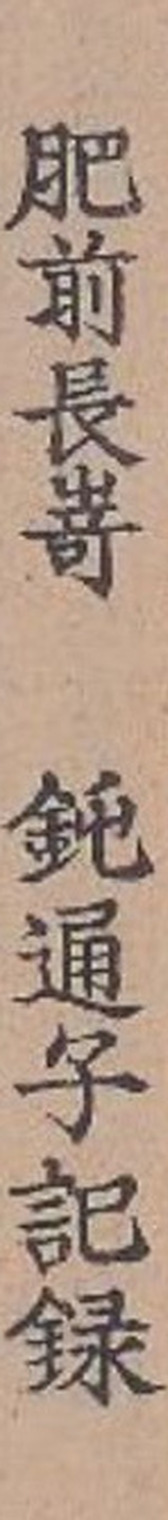肥前長崎鈍通子記録
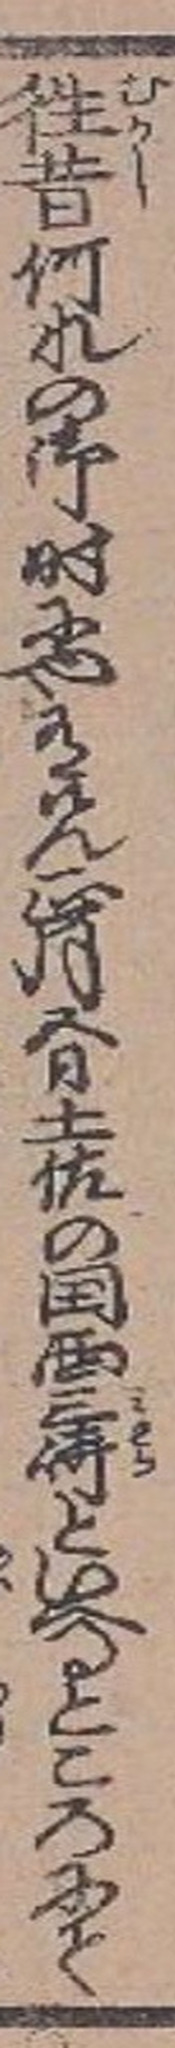往昔何れの御時にや有けん正月五日土佐の国西三崎といへるところにて
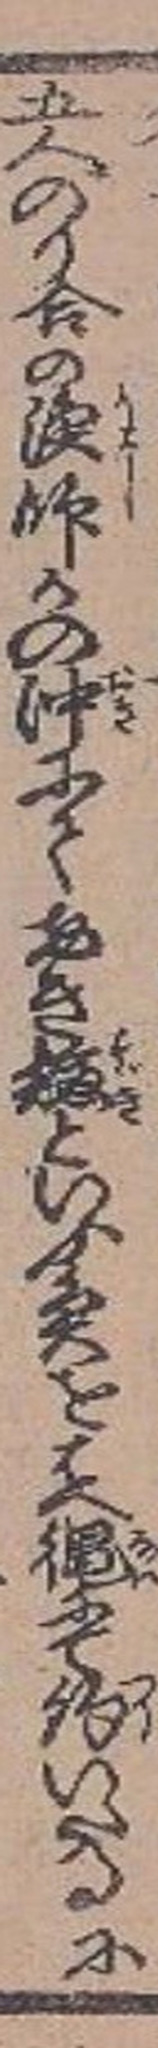五人のり合の漁師かの沖にて鱸といふ魚をはへ縄にて釣いたるに
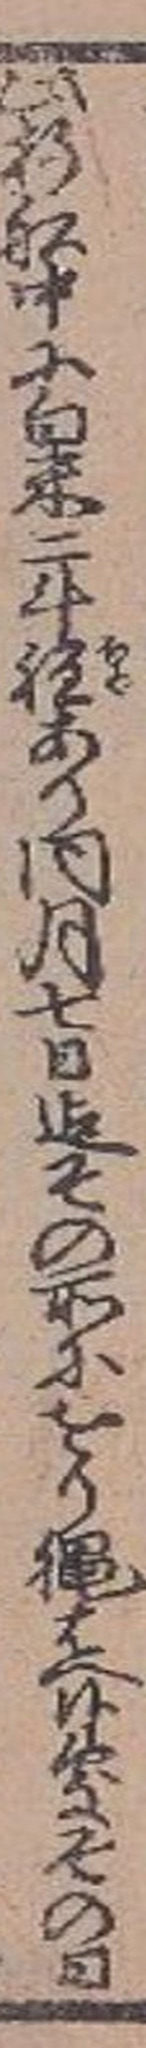此折船中に白米二斗程あり同月七日迄その所にをり縄はへ候処その日
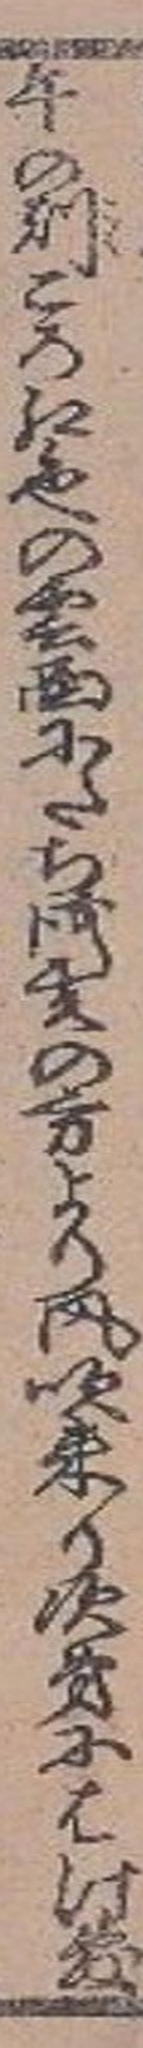午の刻ころ紅色の雲西にたち戌亥の方より風吹来り次第にはけ敷
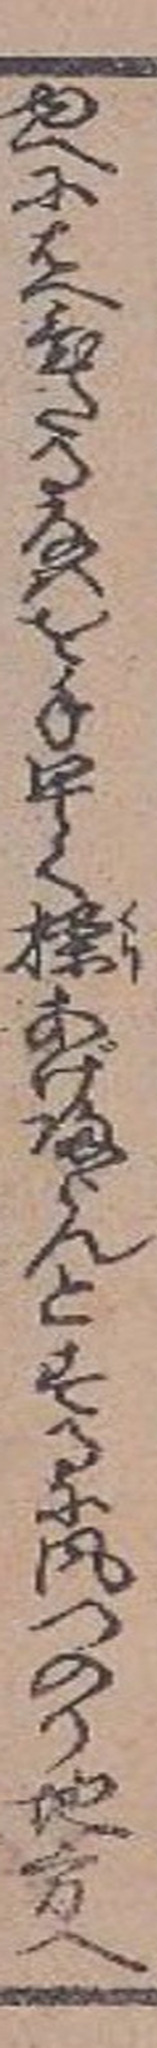ゆへにはへ置たるなはを手早く操あげ帰らんとするに風つのり地方へ
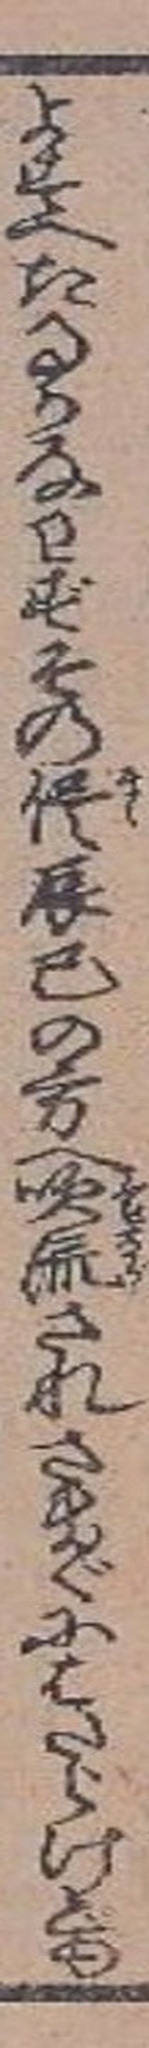よすへき事かなわずその儘辰巳の方へ吹流されさま〴〵にはたらけども
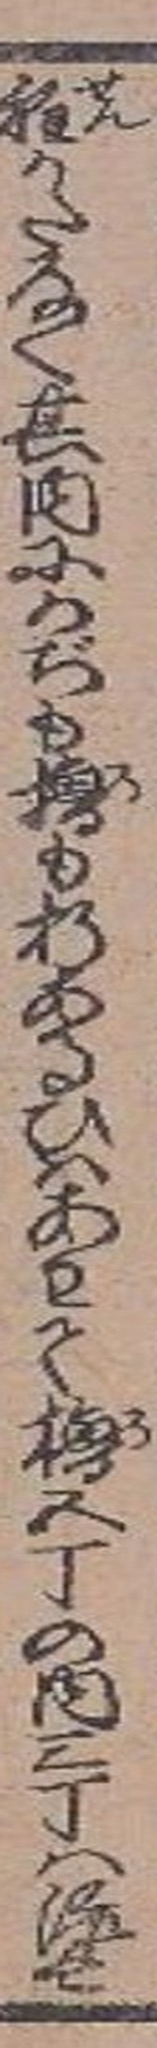詮かたなく其内にかぢも櫓も折あるひはあわて櫓五丁の内三丁は流て
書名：満次郎漂流記
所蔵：University of the Ryukyus Library
